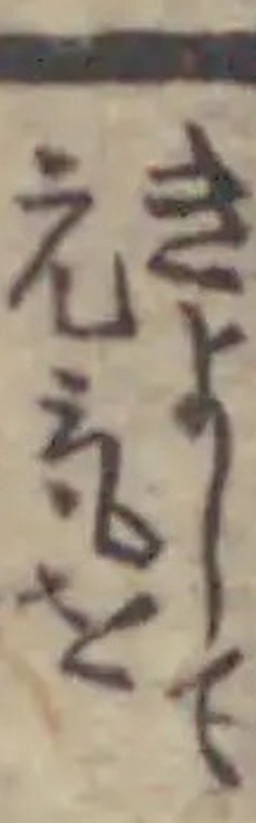元気を
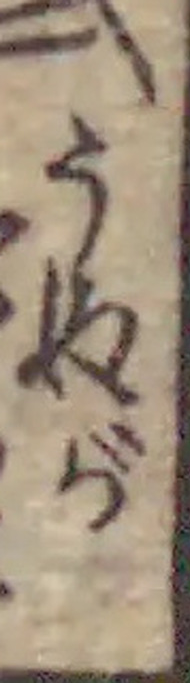うぬが
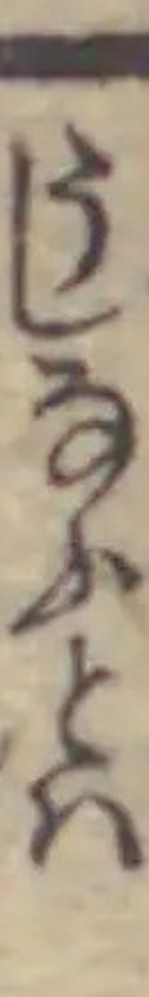うしなふとは
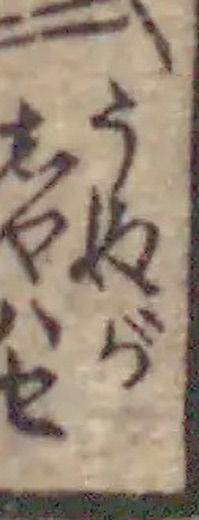しやはせ
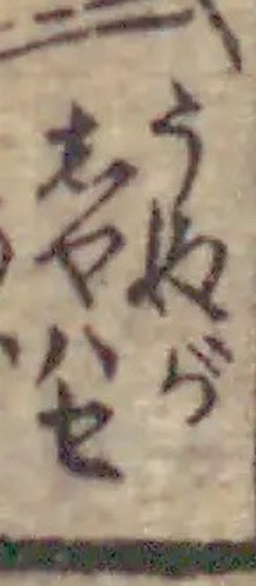しやはせ
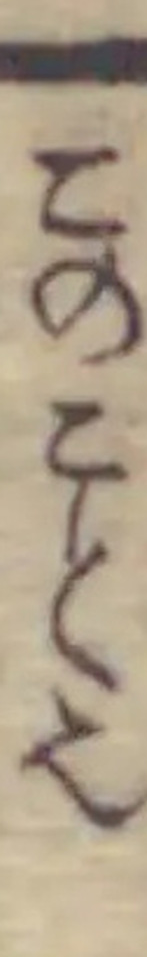このこと也
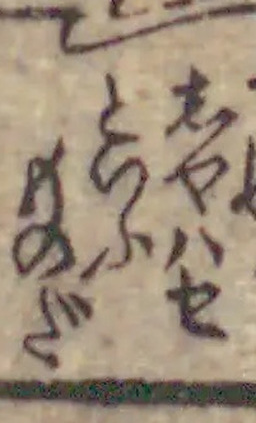ものだ
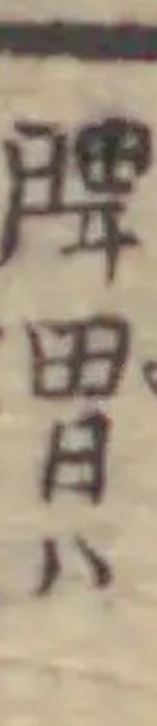脾胃は
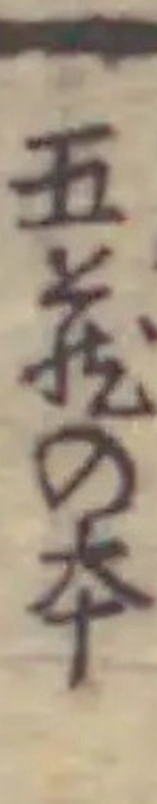五蔵の本
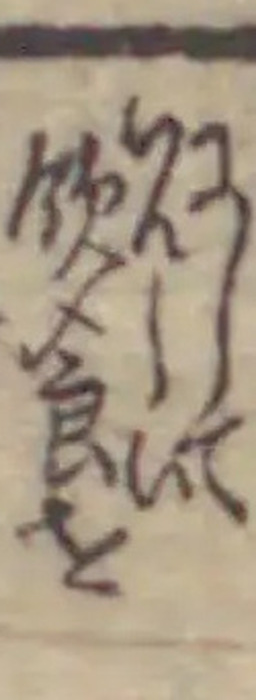飲食を
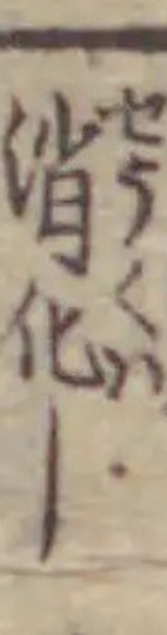消化し
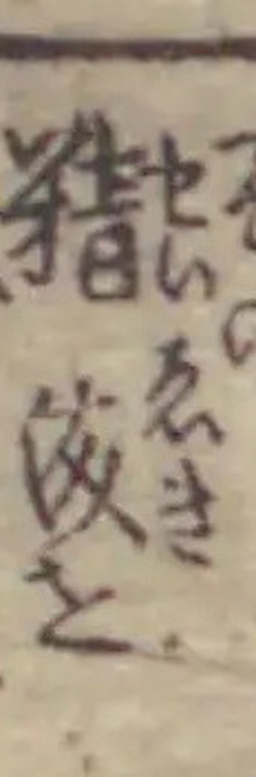精液を
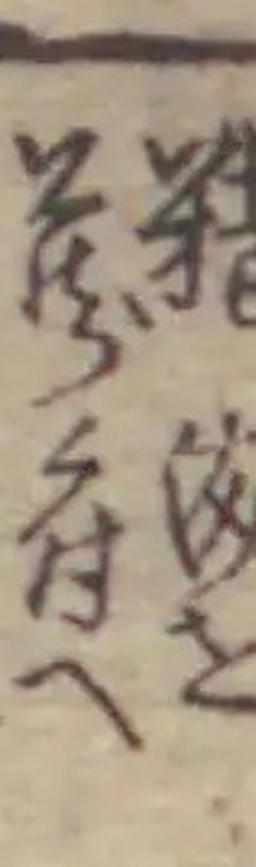蔵符へ
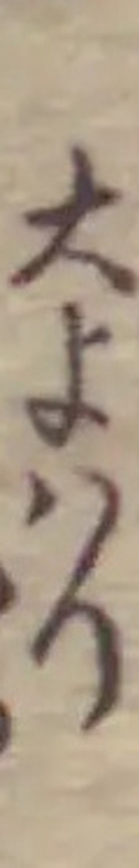大よはり
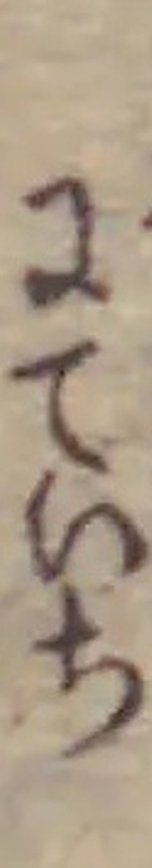にていち
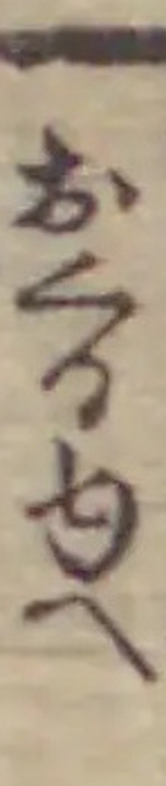おくるゆへ
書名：腹内養生主論 3巻
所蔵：国立国会図書館 National Diet Library, JAPAN
